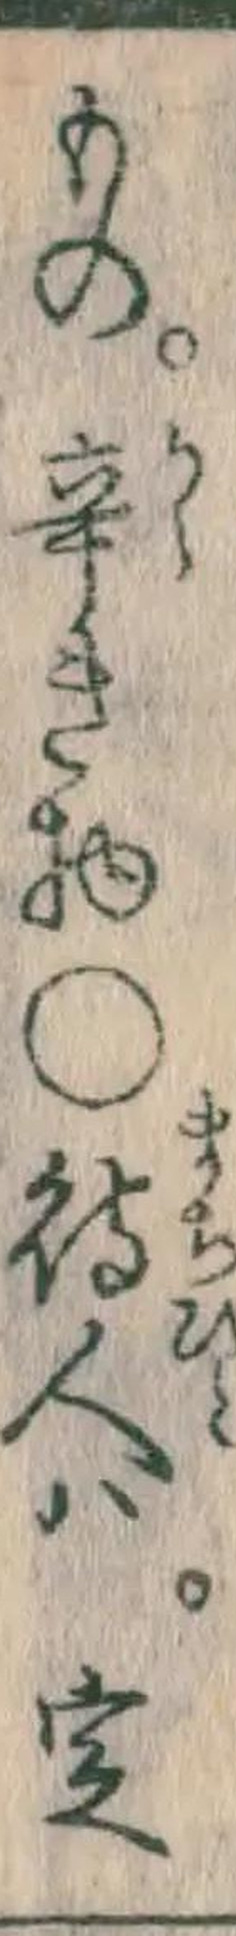もの。辛き物○待人は。定
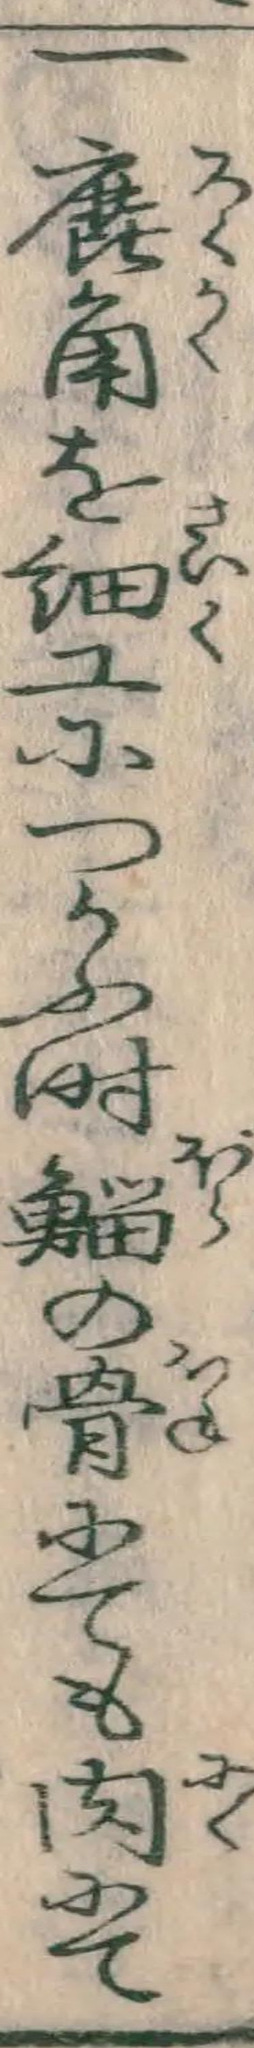一鹿角を細工につかふ時鯔の骨にても肉にて
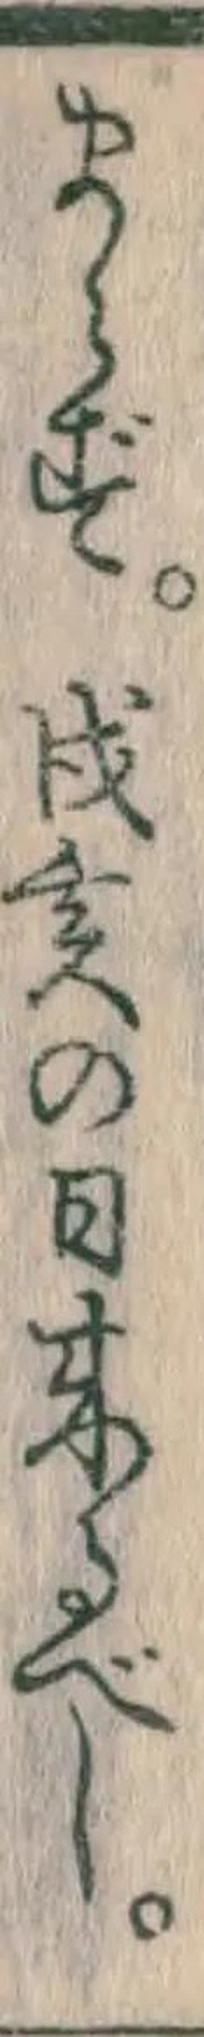まらず。戌亥の日来るべし。
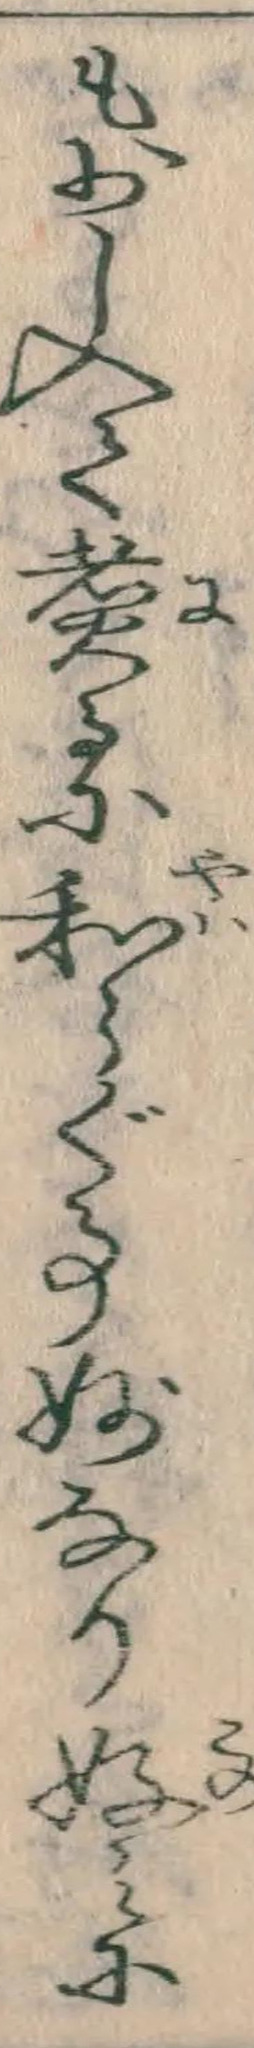も少し入て煮るに和らぐ事妙なり好みに
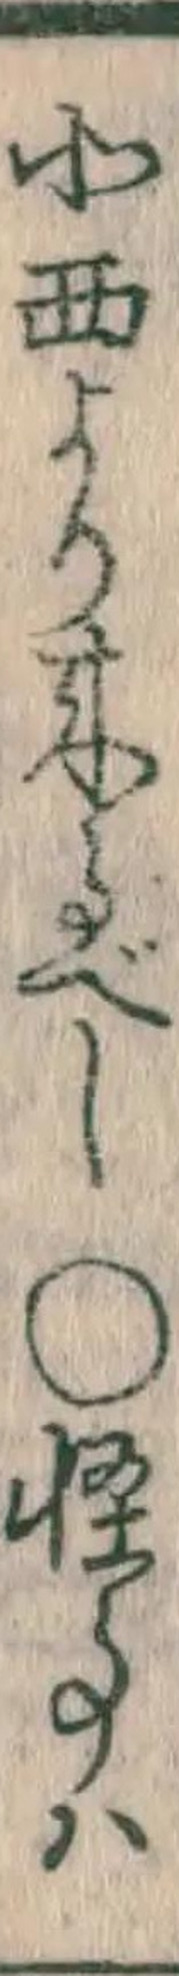北西より来るべし○怪事は
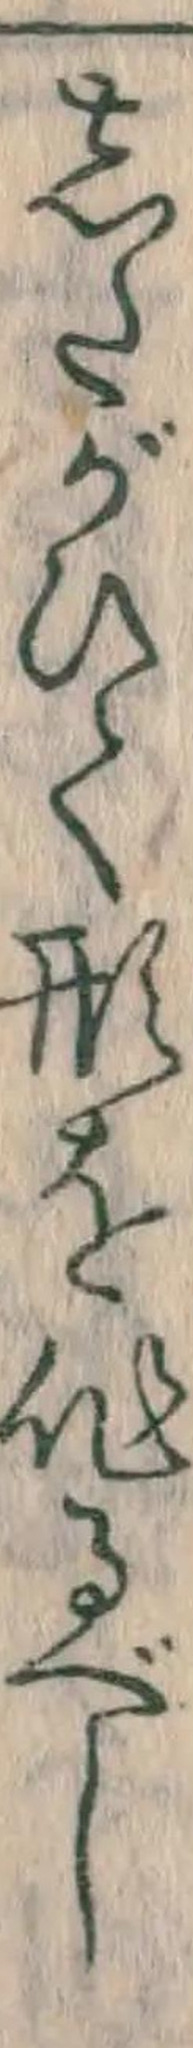したがひて形を作るべし
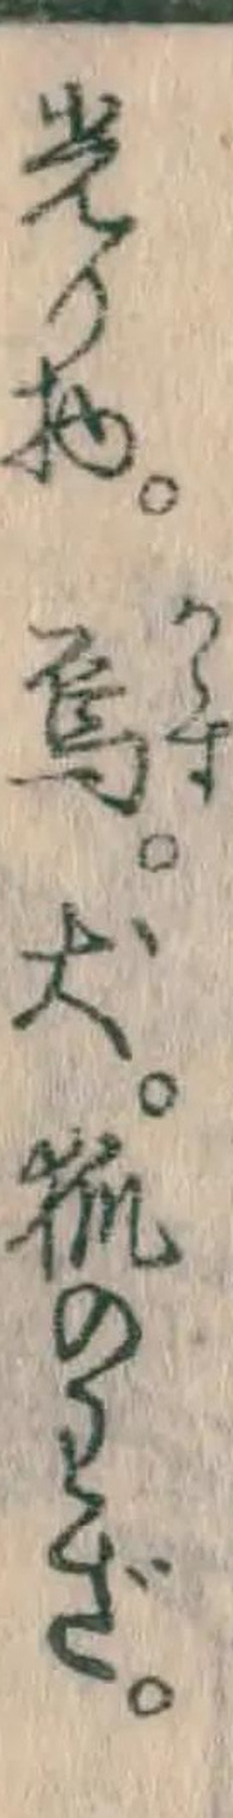光り物。烏。犬。狐のわざ。
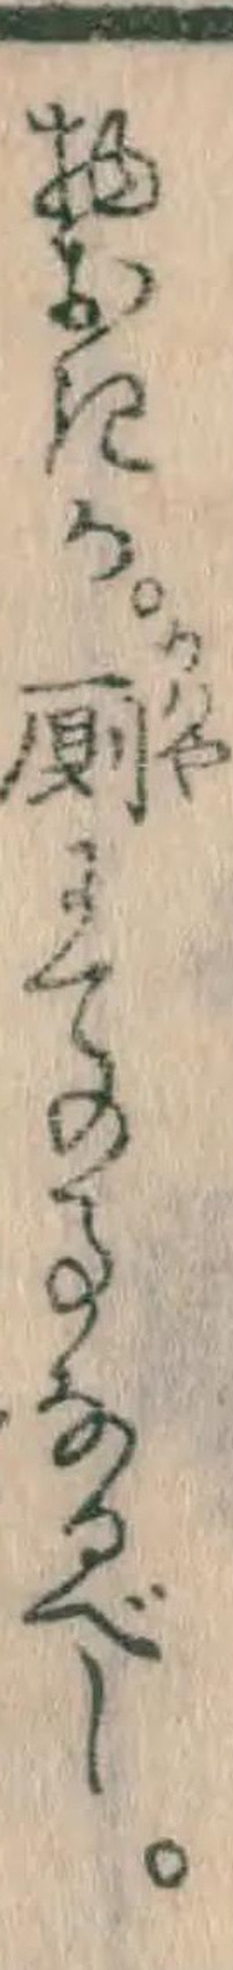物おきか。厠にての事なるべし。
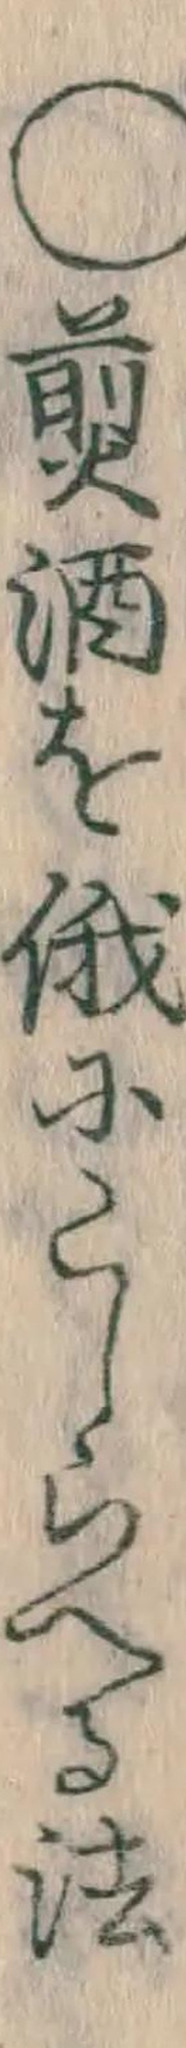○煎酒を俄にこしらへる法
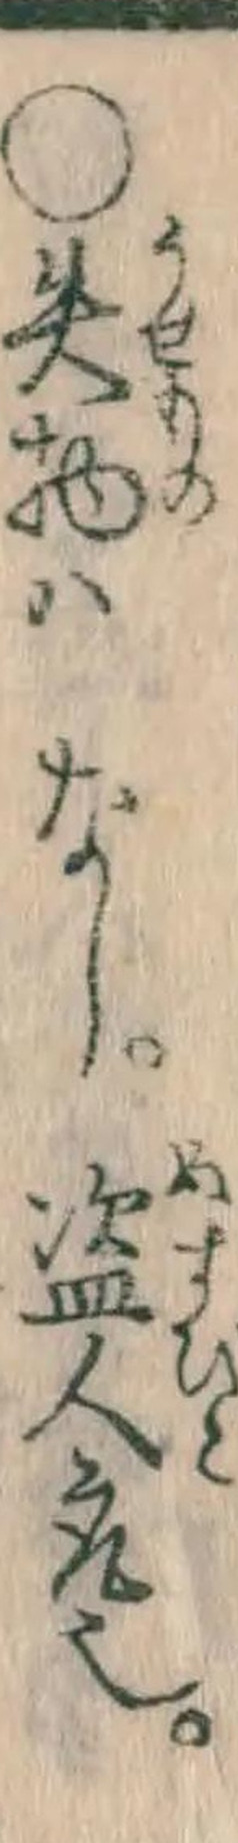○失物はなし。盗人取也。
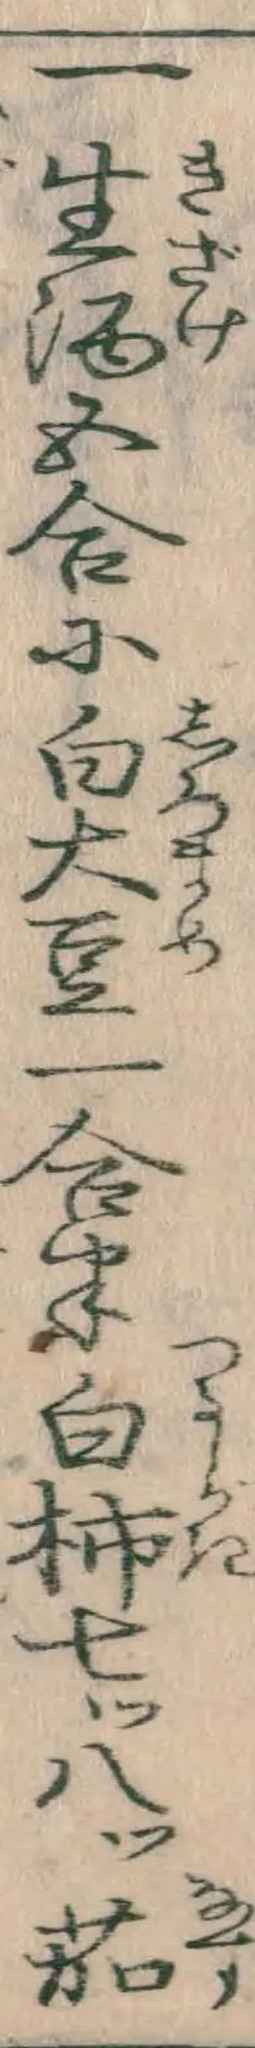一生酒五合に白大豆一合半白柿七ッ八ッ茄
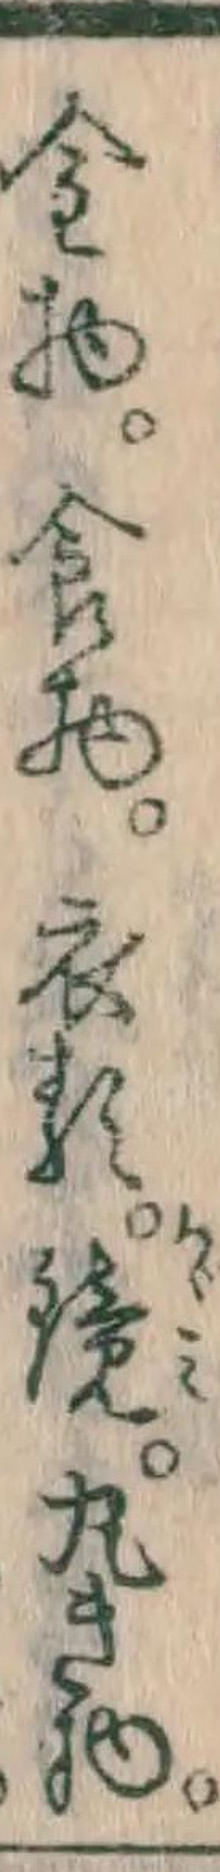金物。食物。衣類。鏡。丸き物。
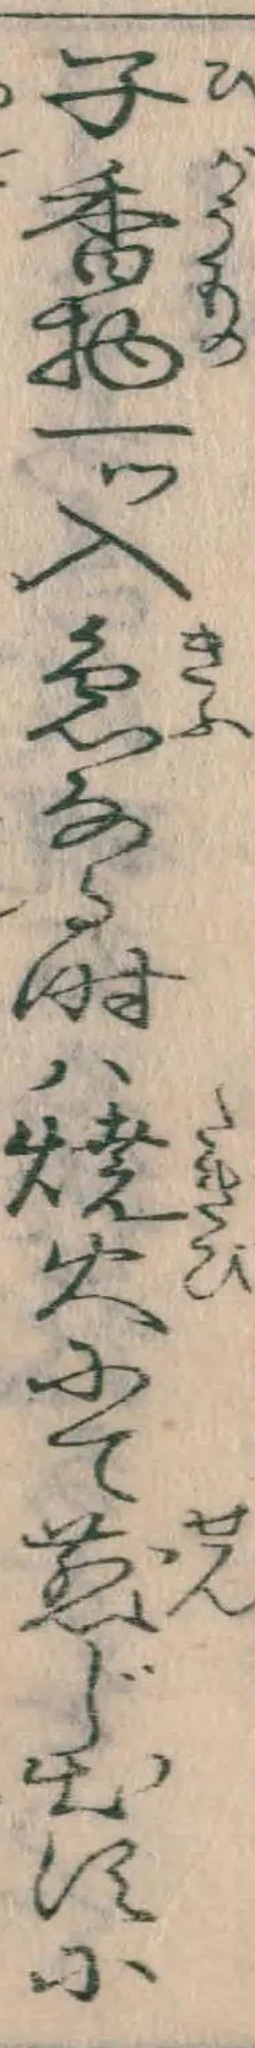子香物一ッ入急なる時は焼火にて煎じ出すに
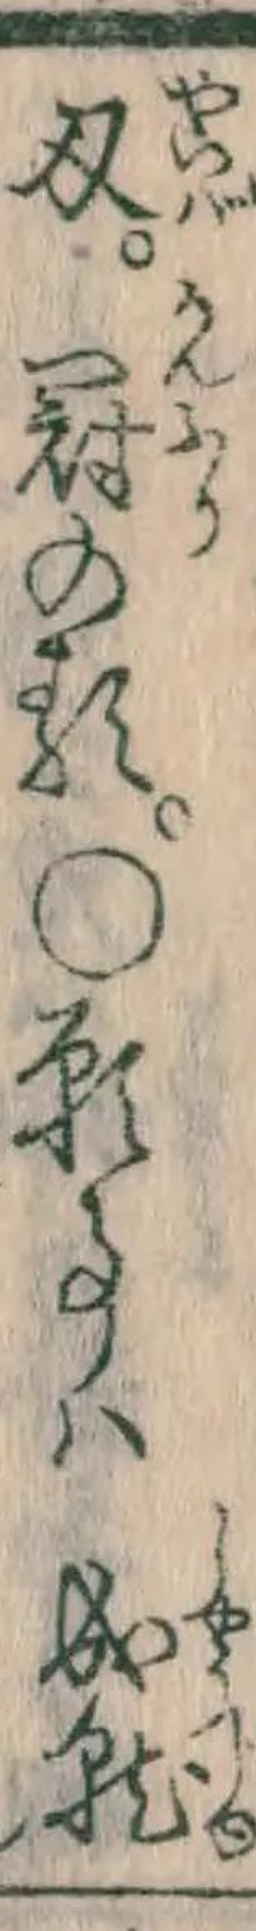刃。冠の類。○願事は成就
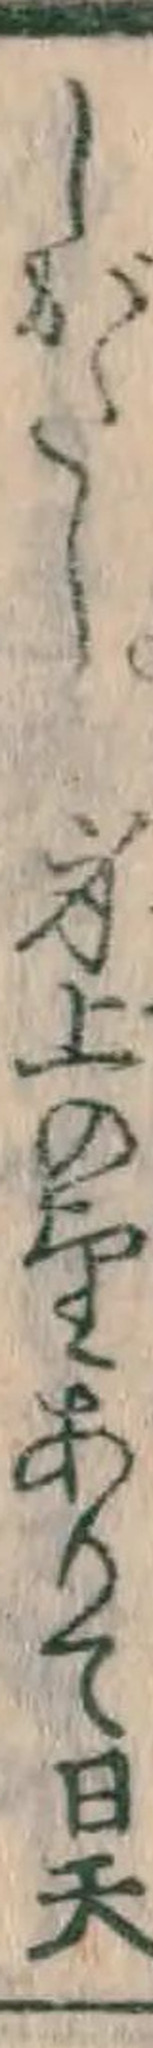しがたし。身上の望ありて日天
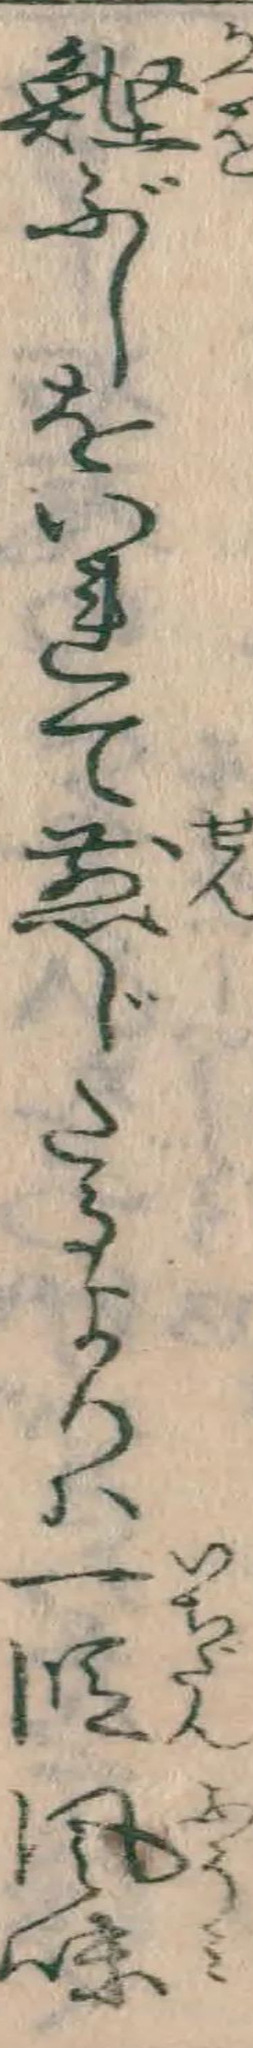鰹ぶしをいれて煎じたるよりは一段風味
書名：広益秘事大全 3巻. [1]
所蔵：国立国会図書館 National Diet Library, JAPAN
